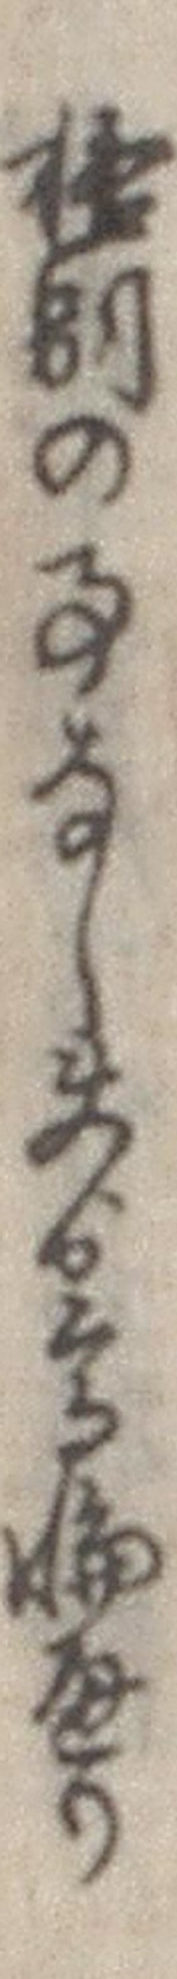格別の事なし夫ゟ高輪通り
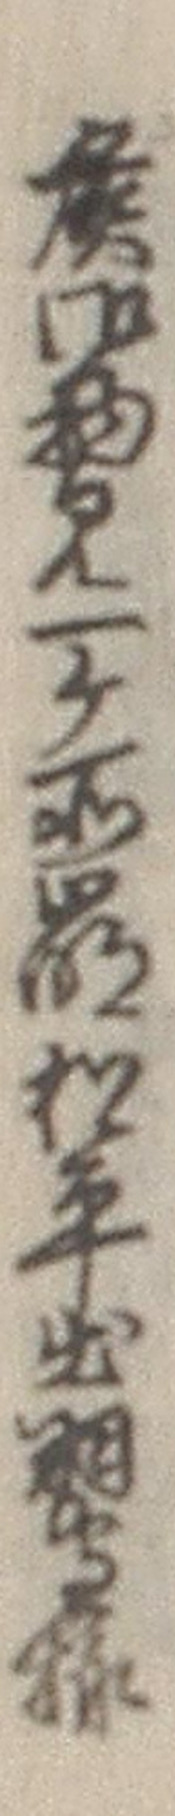侯御物見一ケ処崩松平出羽守様
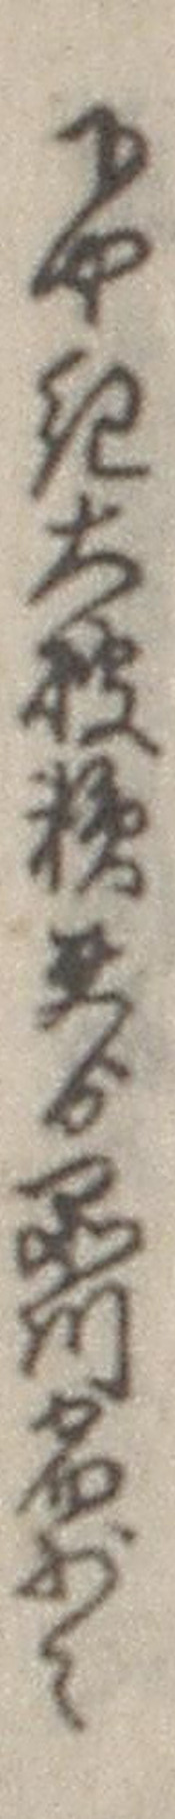下やしき大破損夫ゟ品川宿少〻
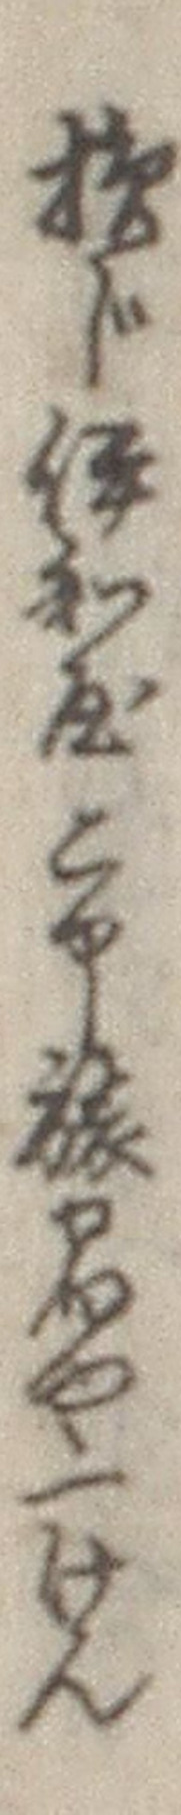損じ伊和屋と申旅宿や一けん
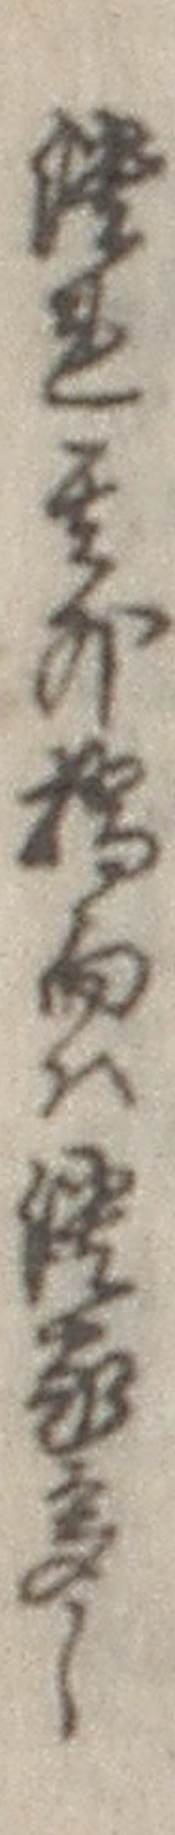潰れ其外橋向は潰家多し
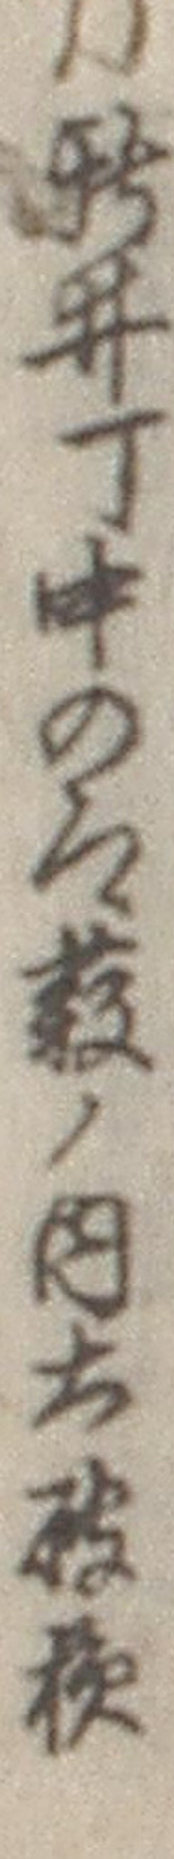新井丁中の郷薮ノ内大破損
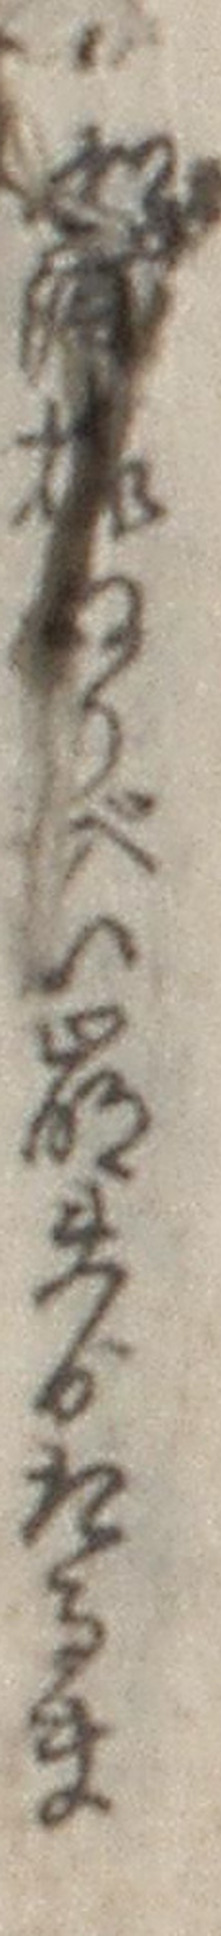松浦様ねりべひ崩夫ゟたるま
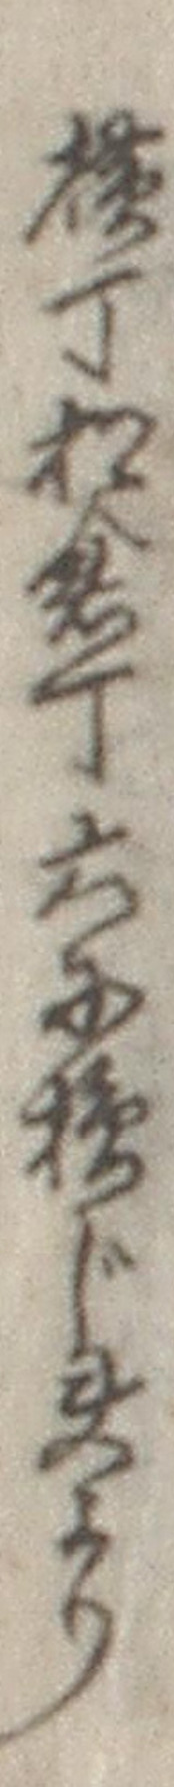横丁松倉丁大に損じ夫より
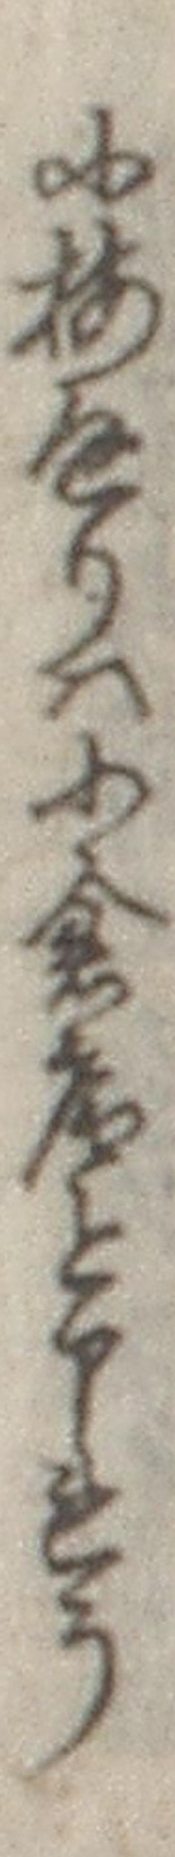小梅通りは小倉屋と申れう
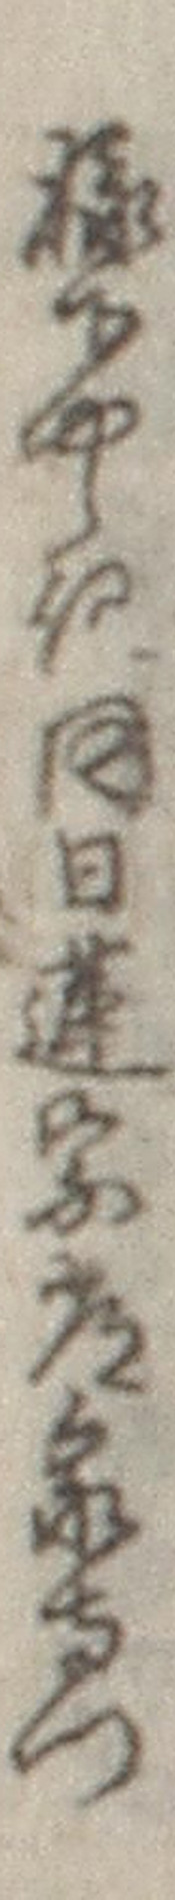様下やしき同日蓮宗養泉寺門
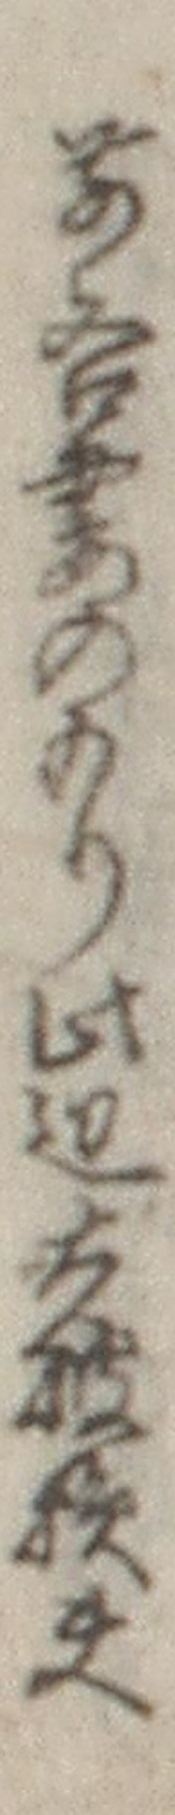前吾妻のもり此辺大破損夫
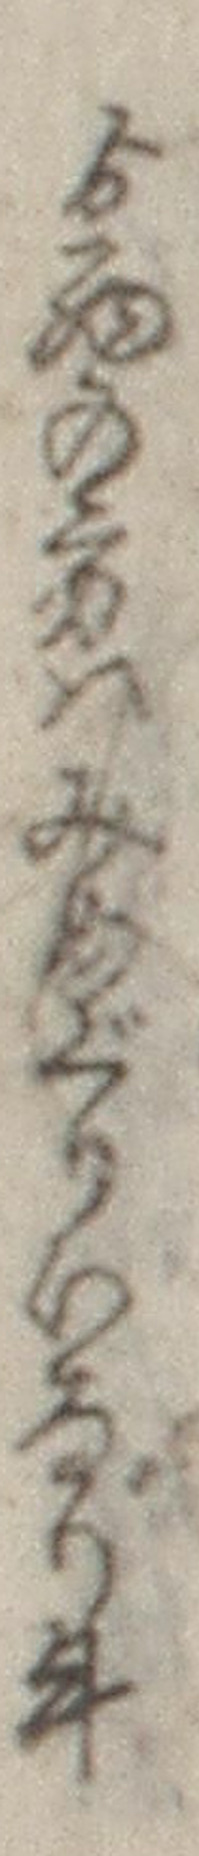ゟ西の方はみめぐりいなり牛
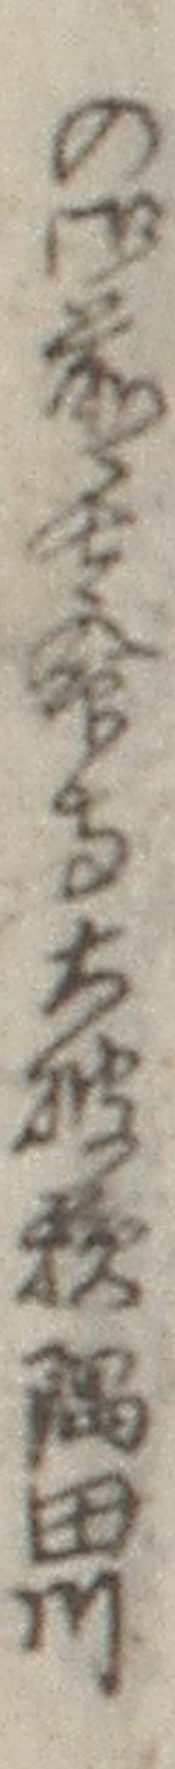の御前長命寺大破損隅田川
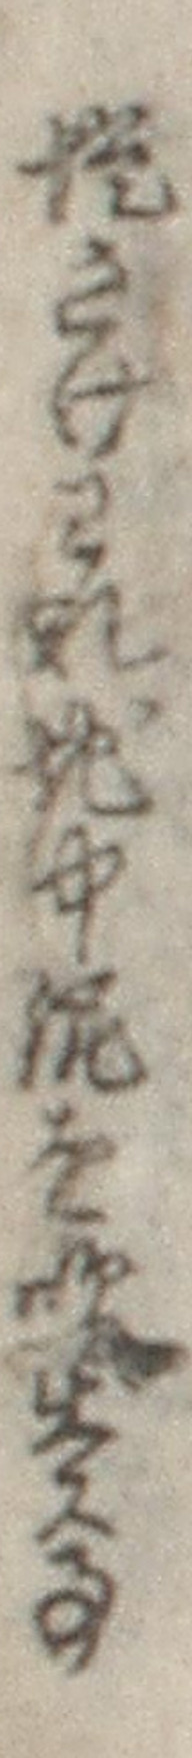堤さけわれ地中泥を吹出ス事
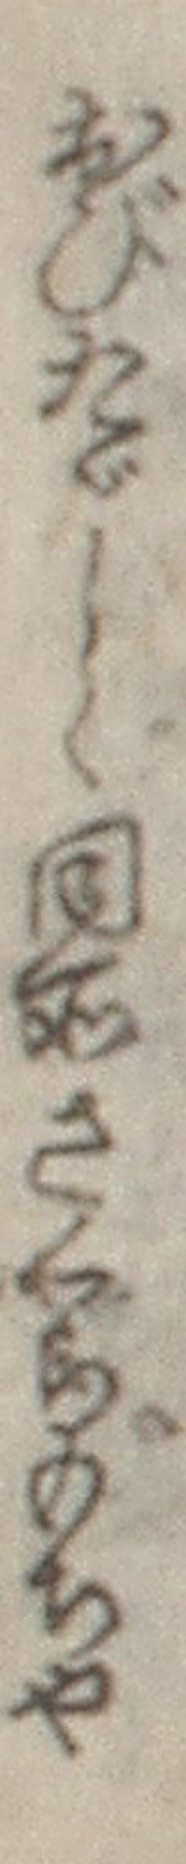おびたゞしく同所さくらのちや
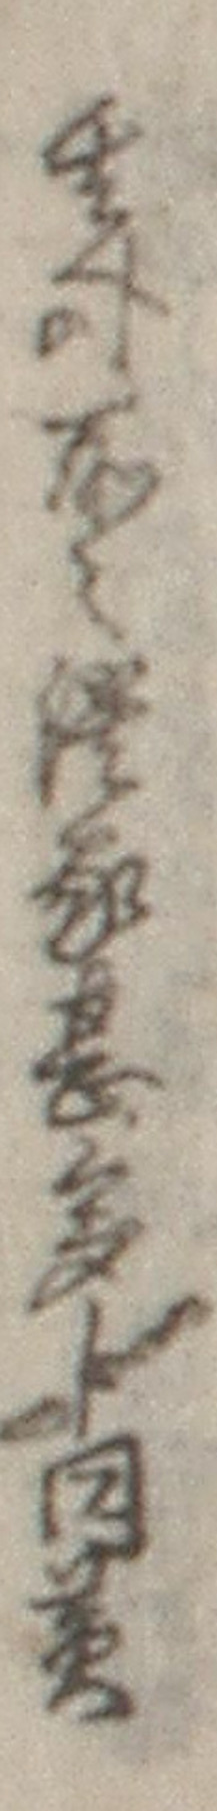其外所〻潰家甚多し同黄
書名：江戸　大地震臣細録　全
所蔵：東京大学地震研究所図書室 Earthquake Research Institute Library, The University of Tokyo, JAPAN
